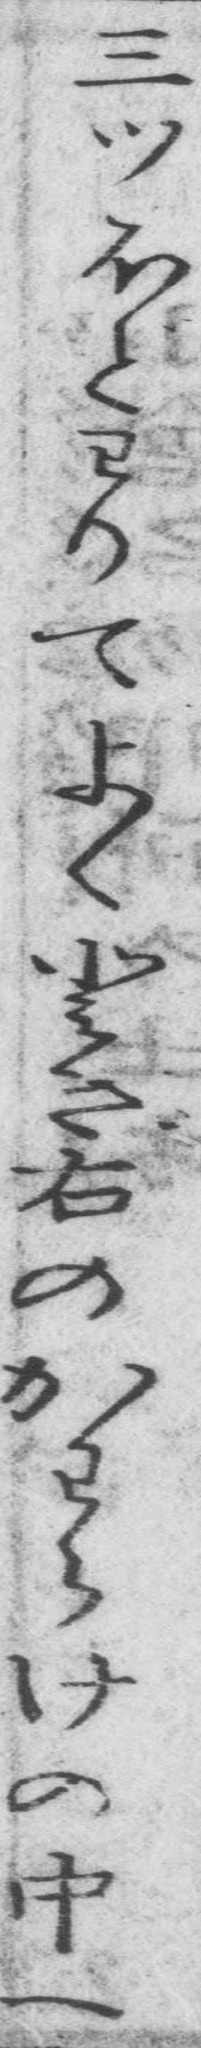三ツほとわりてよくとき右のかわらけの中へ
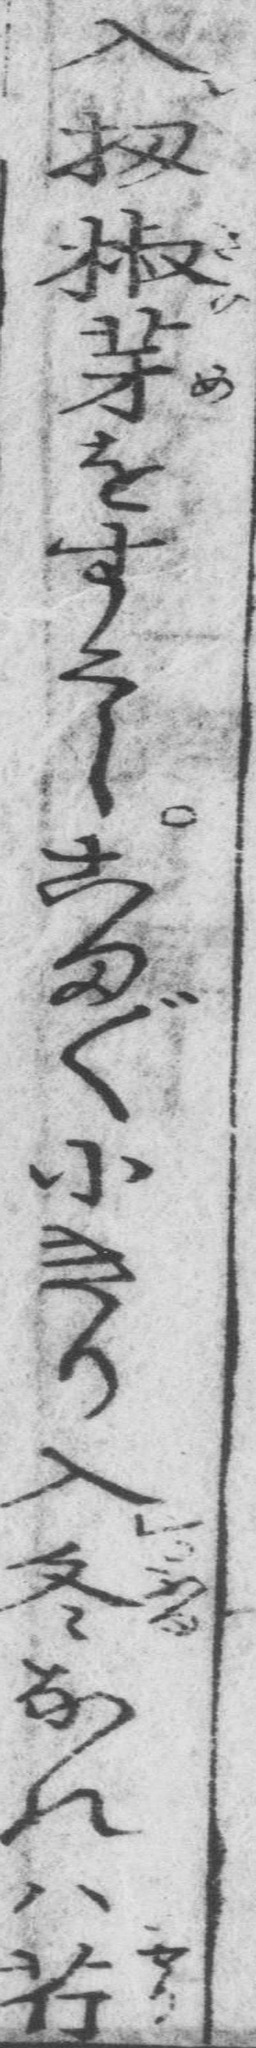入れ扨椒芽をすこし。こま〴〵にきり入れ。冬なれは芹
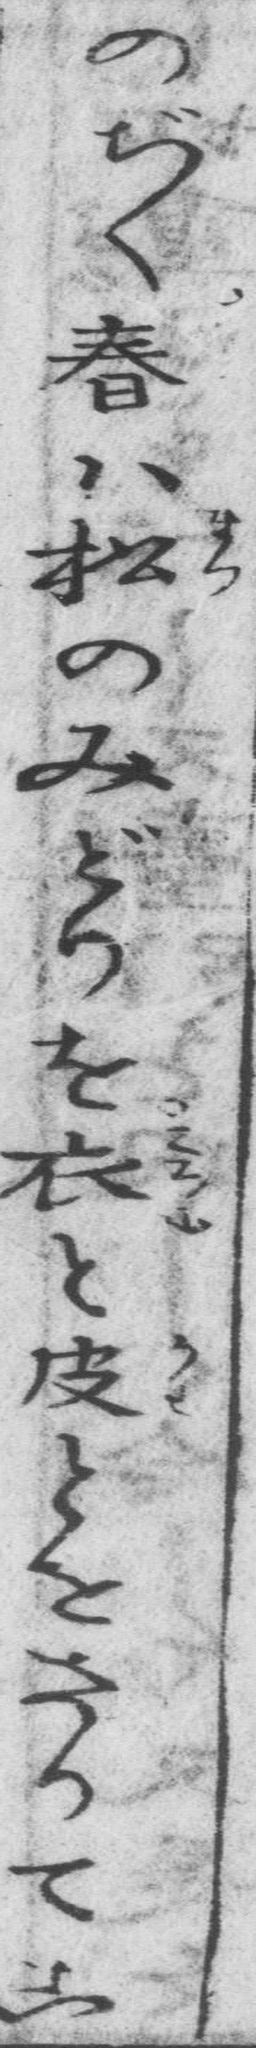のぢく。春は松のみどりを。衣と皮とをさりてこ
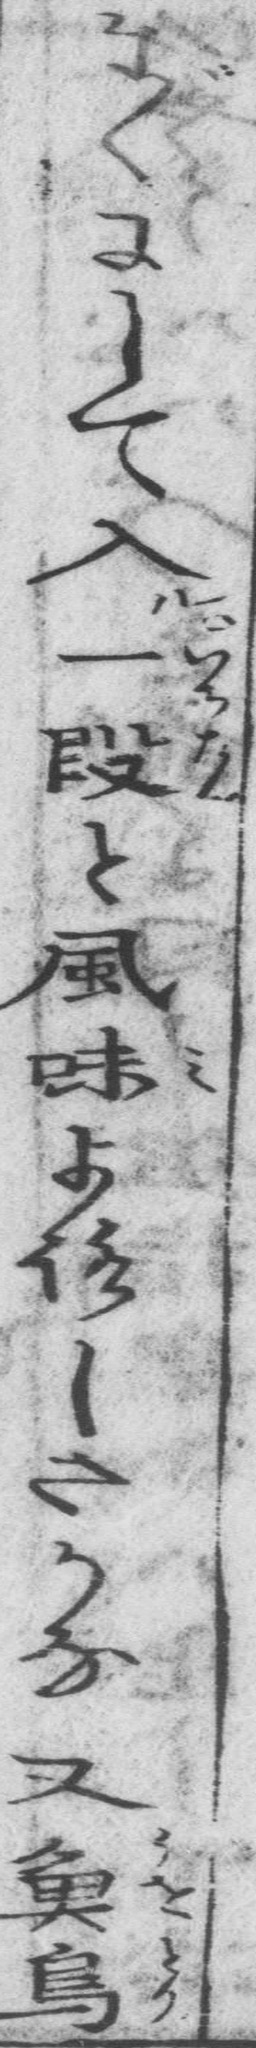ま〴〵にして入る。一段と風味よろしさかな又魚鳥
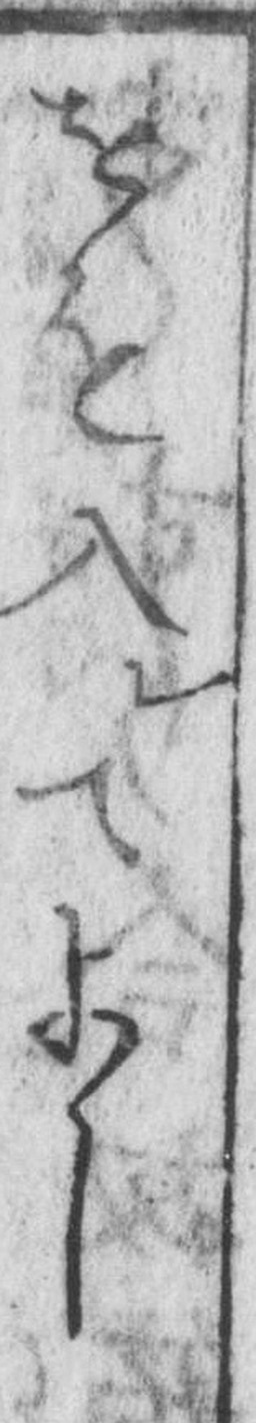をも入れてよし
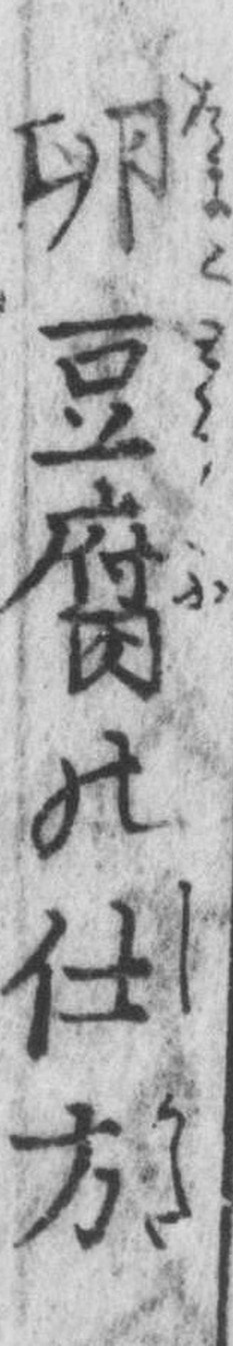卵豆腐の仕方
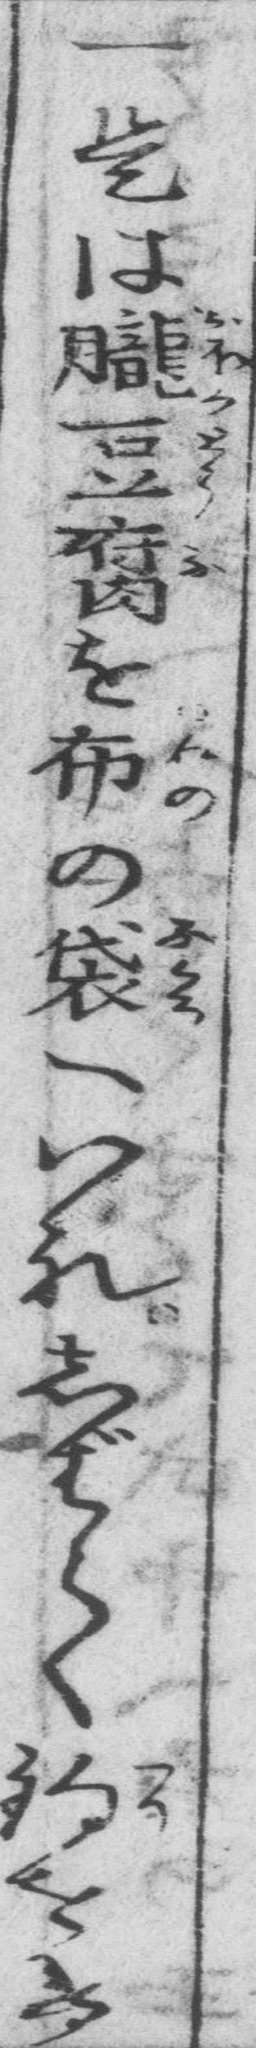一是は朧豆腐を布の袋へいれ。しばらく釣をけ
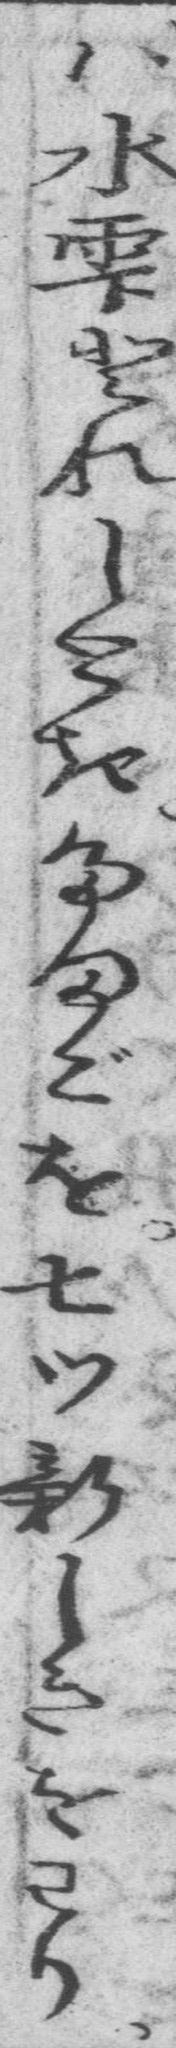ば。水雫としれとき。たまごを。七ツ新しきをわり。

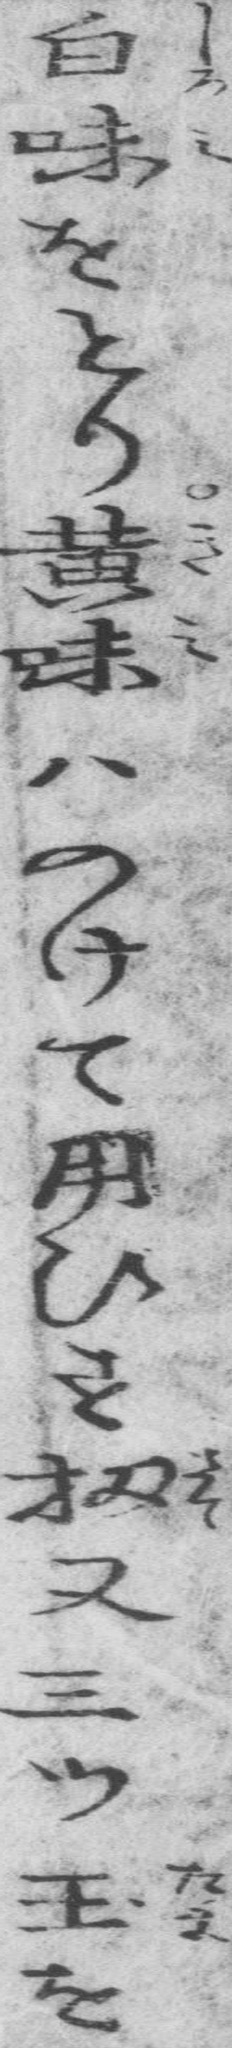白味をとり。黄味はのけて用ひす扨又三ツ玉を
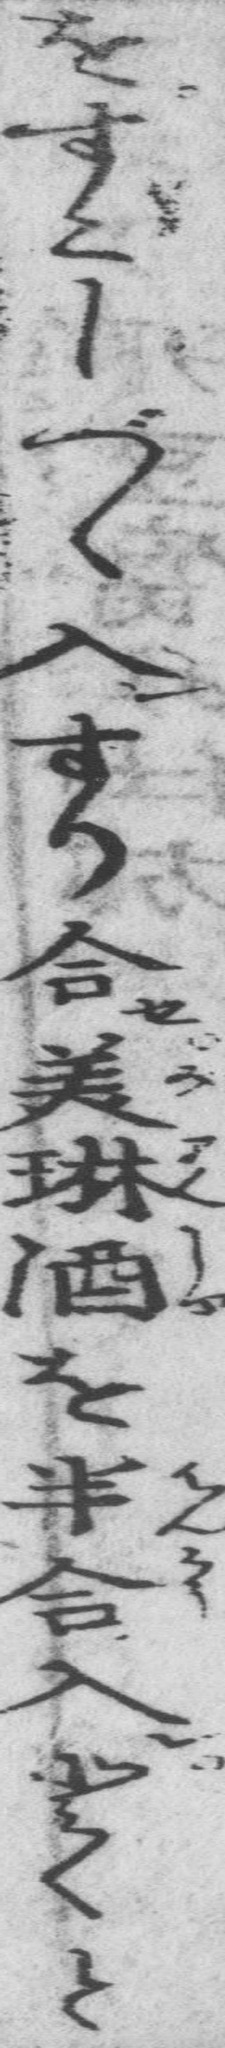を。すこしづゝ入れすり合せ。美醂酒を半合入れ。とくと
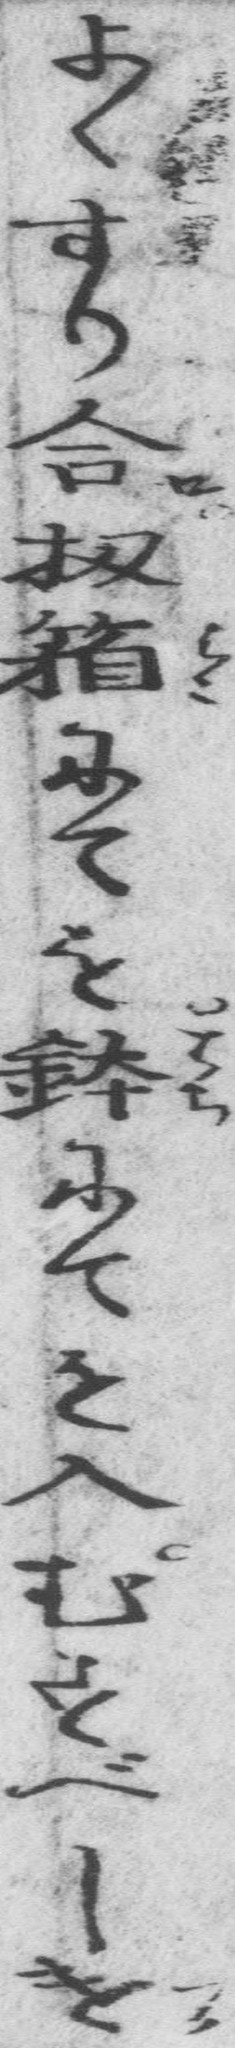よくすり合せ。扨箱にても。鉢にても入、むすべし遣
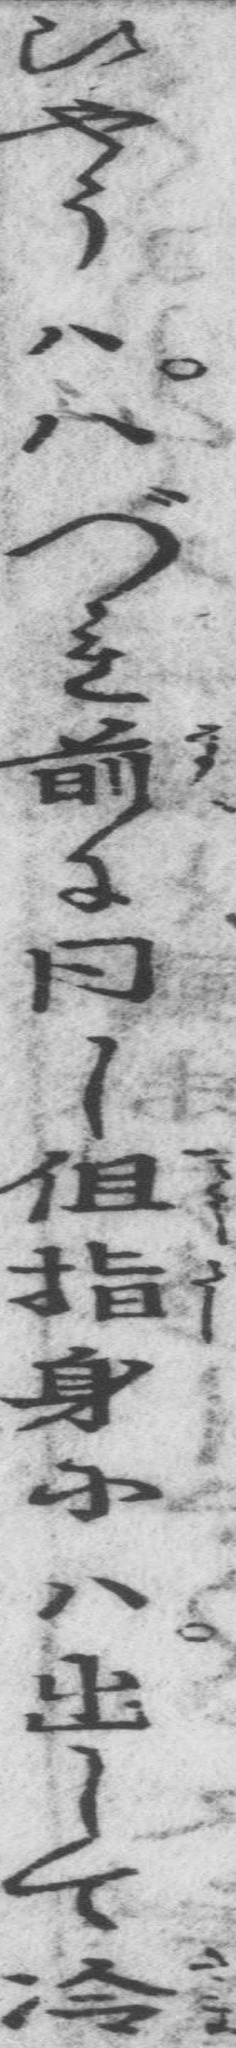ひやうは。いづれ前に同し但指身には。出して冷
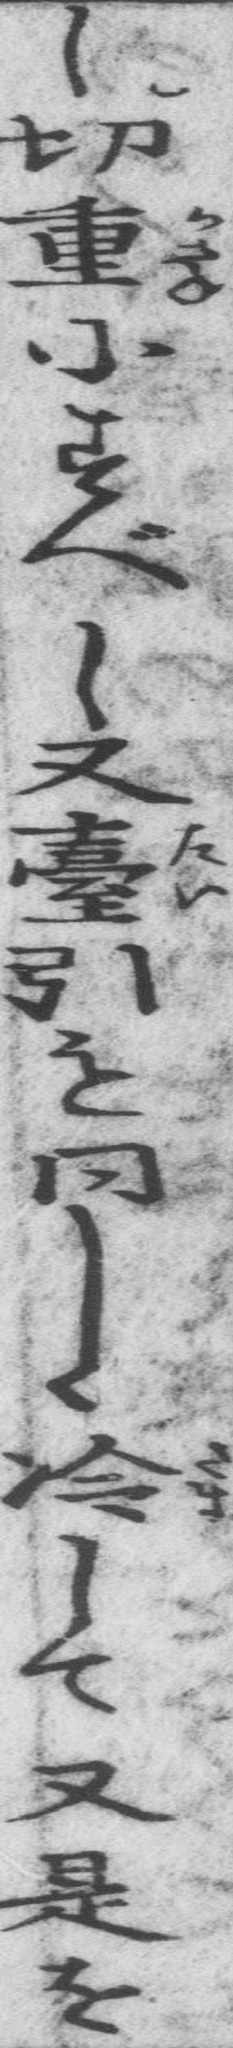し。切重にすべし又台引きも同しく冷して又是を
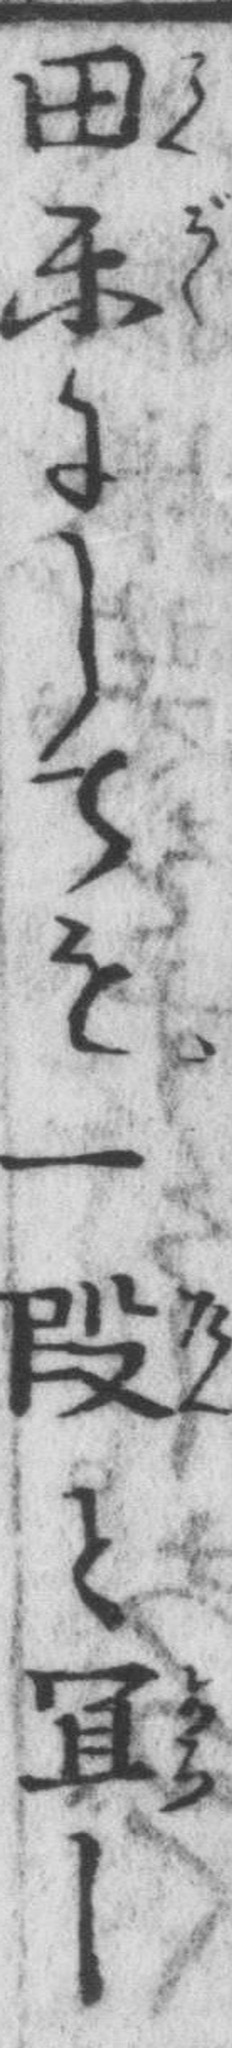田楽にしても。一段と宜し
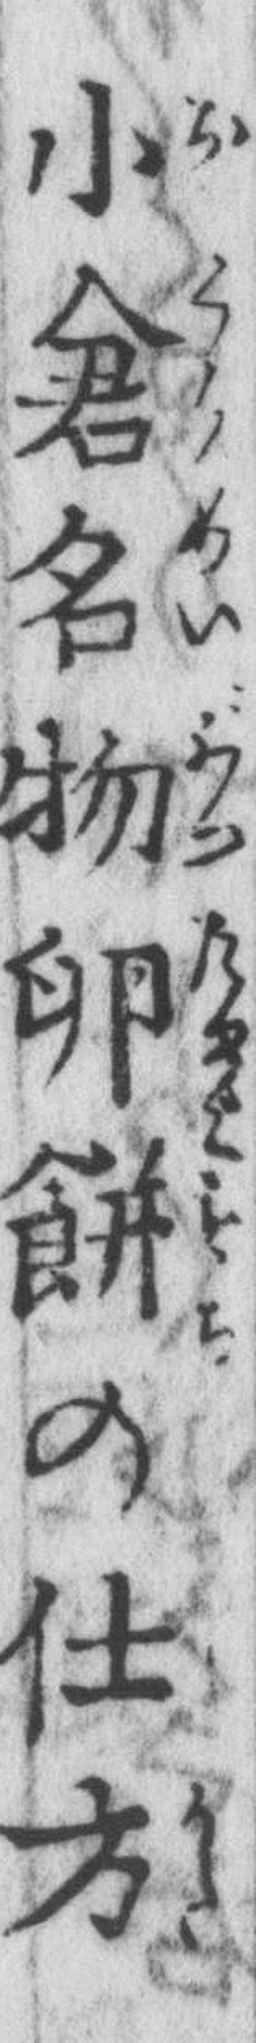小倉名物卵餅の仕方
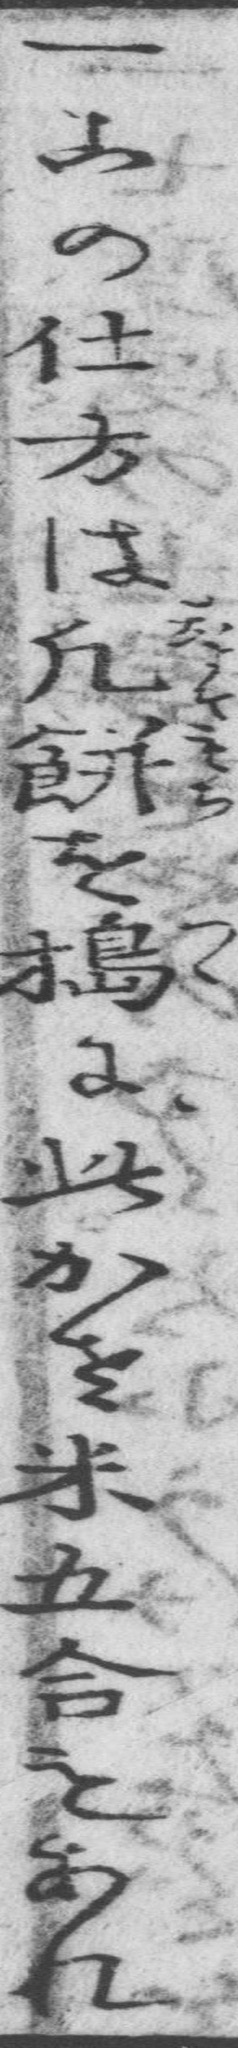一この仕方は。凡餅を搗に。此かさ米五合もあれ
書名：萬寳料理秘密箱
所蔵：大阪府立大学学術情報センター 国文学研究資料館
